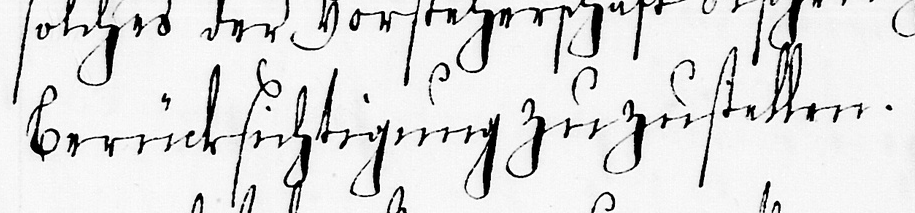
Berücksichtigung zuzustellen.
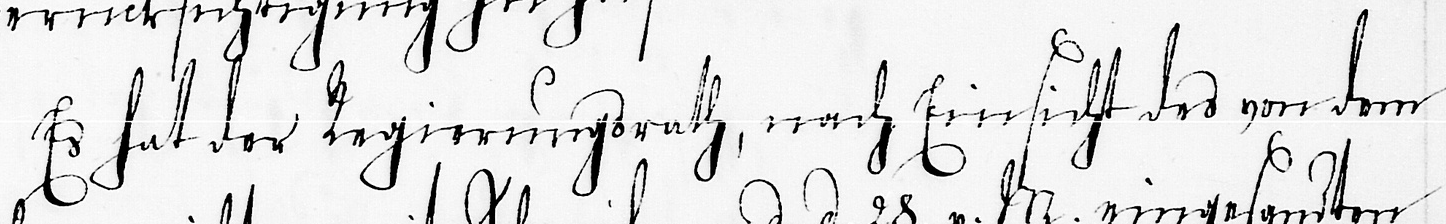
Es hat der Regierungsrath, nach Einsicht des von dem
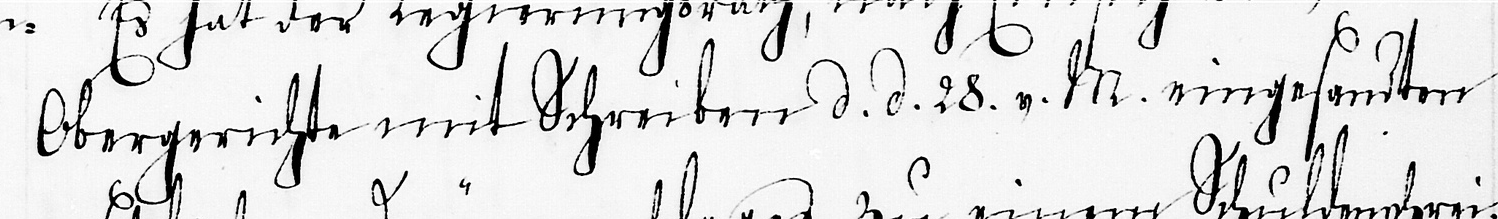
Obergerichte mit Schreiben d. d. 28. v. M. eingesandten
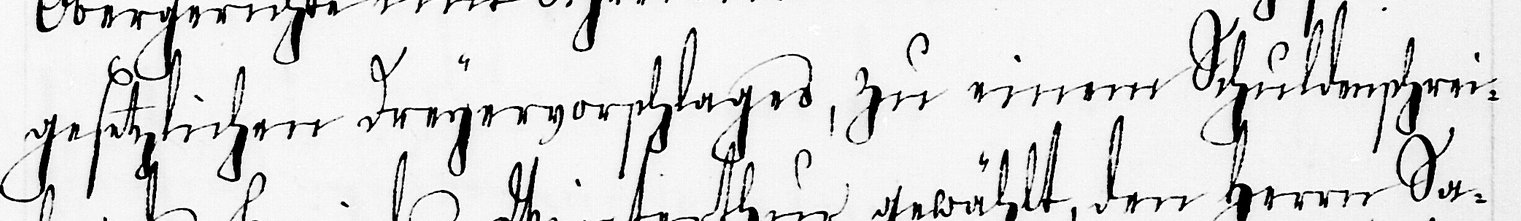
gesetzlichen Dreyervorschlages, zu einem Schuldenschrei¬
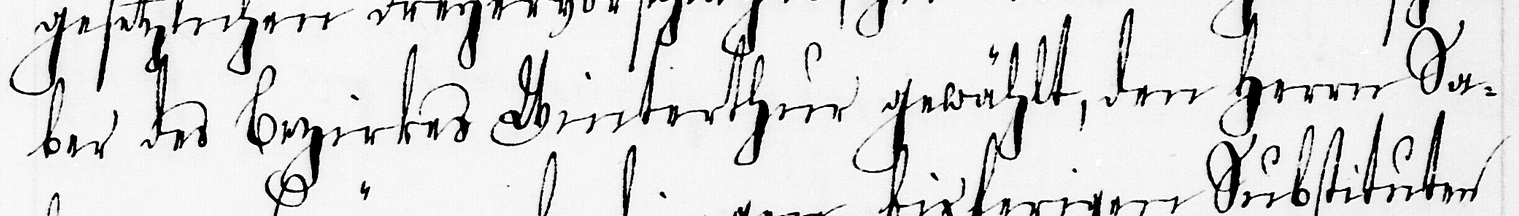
ber des Bezirkes Winterthur gewählt, den Herrn Sa¬
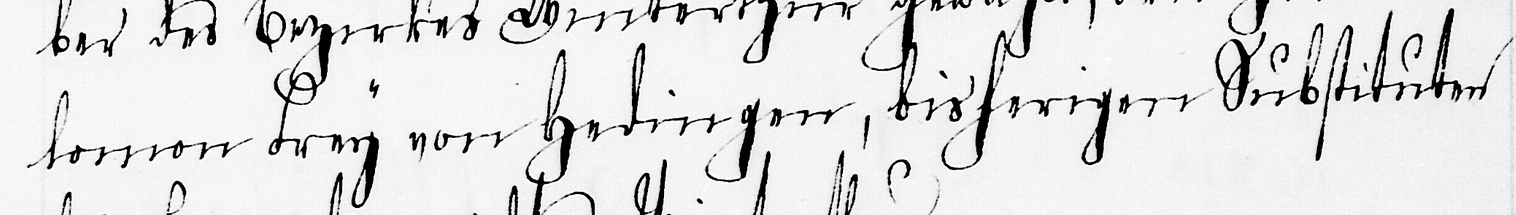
lomon Frey von Hedingen, bisherigen Substituten
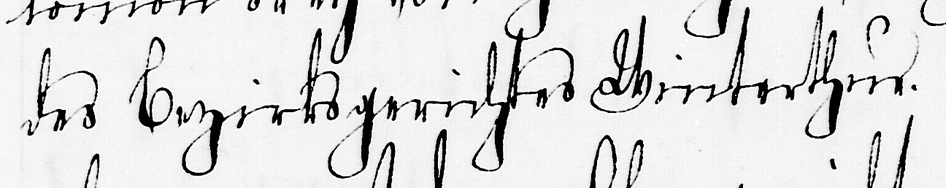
des Bezirksgerichtes Winterthur.
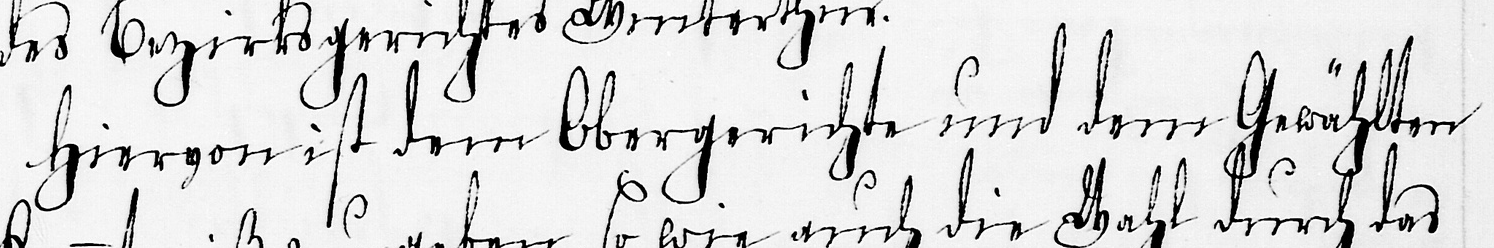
Hiervon ist dem Obergerichte und dem Gewählten
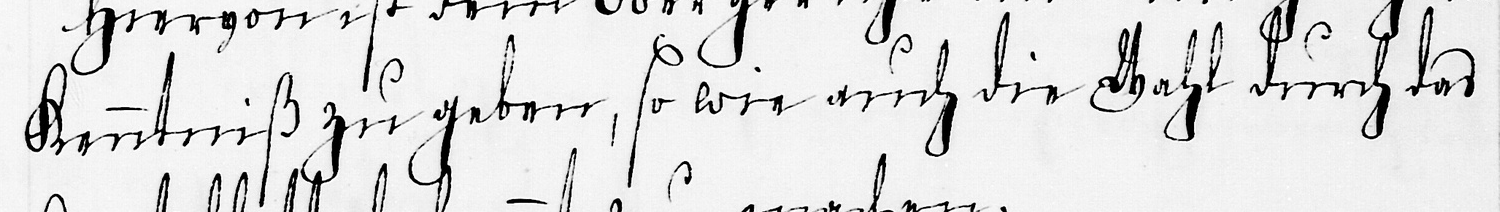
Kenntniß zu geben, so wie auch die Wahl durch das
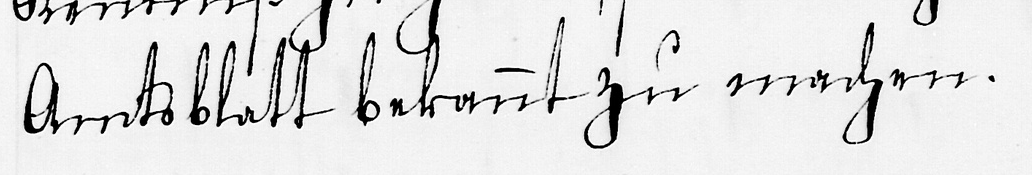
Amtsblatt bekannt zu machen.
